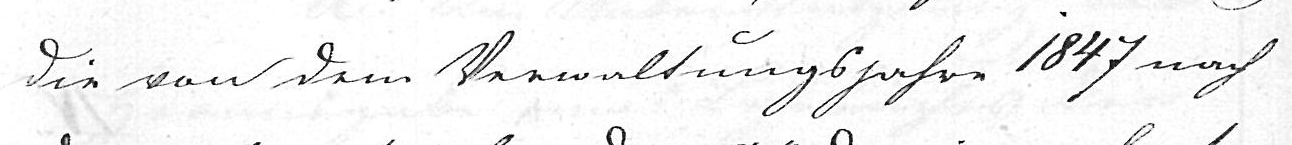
die von dem Verwaltungsjahre 1847 nach
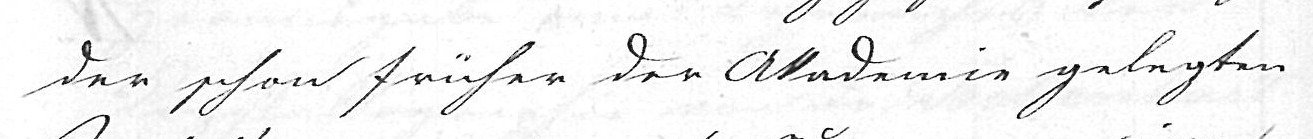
der schon früher der Akademie gelegten
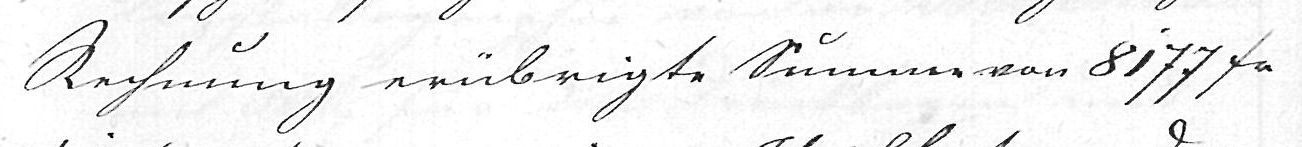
Rechnung erübrigte Summe von 8177 fr
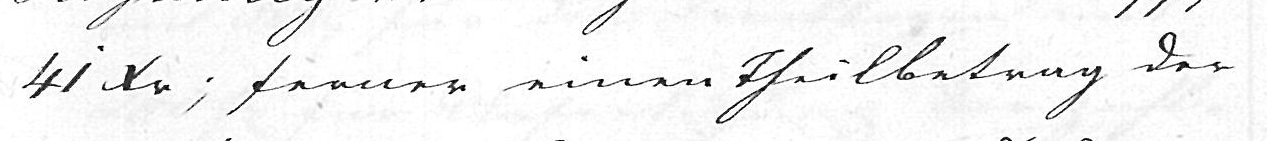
41 kr, ferner einen Theilbetrag der
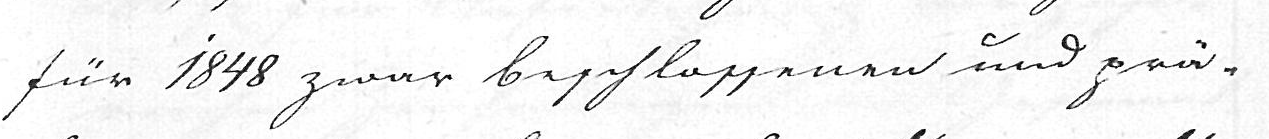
für 1848 zwar beschlassenen und prä-
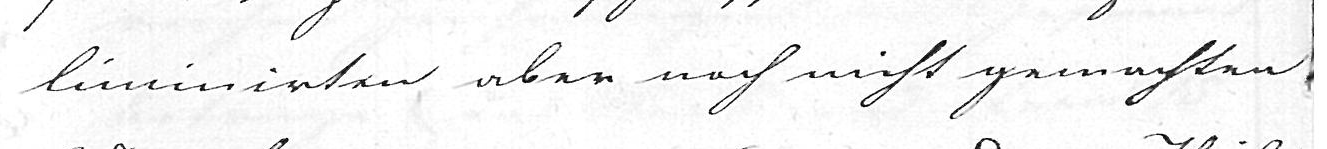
liminirten aber noch nicht gemachten
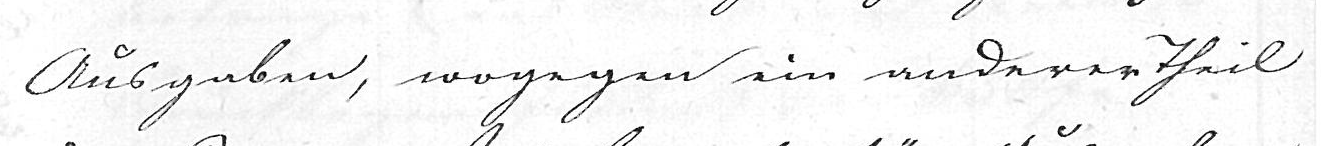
Ausgaben, wogegen ein anderer Theil
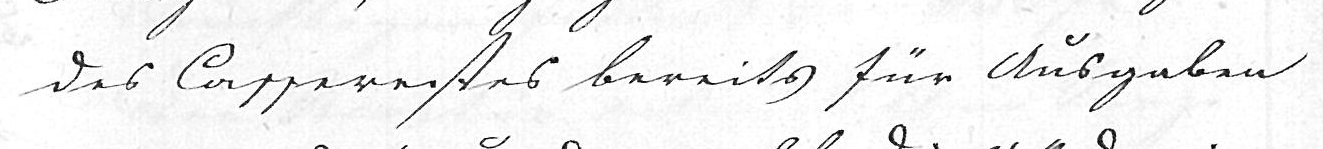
des Casserestes bereits für Ausgaben
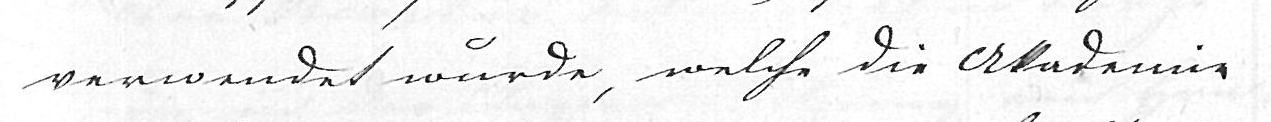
verwendet wurde, welche die Akademie
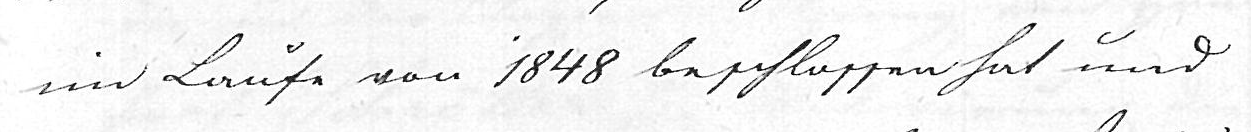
im Laufe von 1848 beschlossen hat und
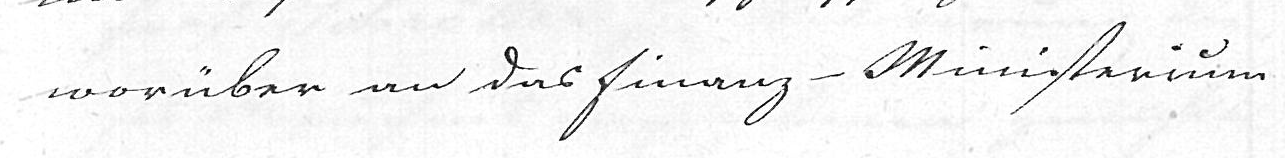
worüber an das Finanz-Ministerium
